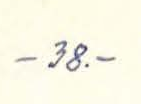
38.
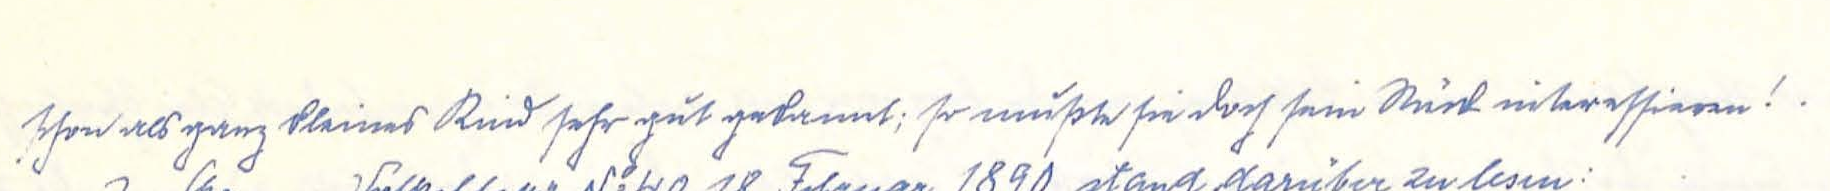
schon als ganz kleines Kind sehr gut gekannt, so musste sie doch sein Stück interessieren!-
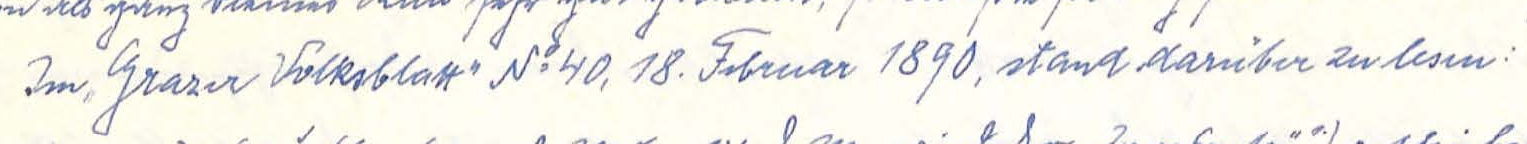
Im "Grazer Volksblatt" Nr. 40,18. Februar 1890, stand darüber zu lesen:
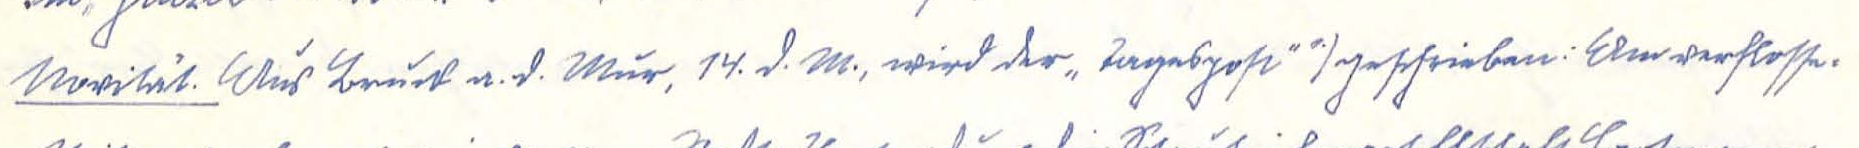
Novität. Aus Bruck a. d. Mur, 14. d. M, wird der "Tagespost" 1.) geschrieben: Am verflossen-
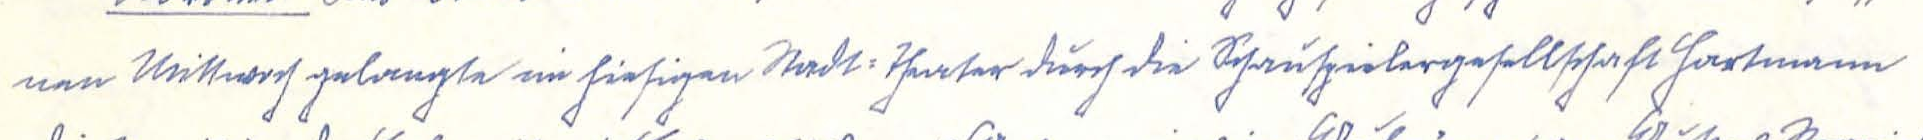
nen Mittwoch gelangte im hiesigen Stadt-Theater durch die Schauspielergesellschaft Hartmann
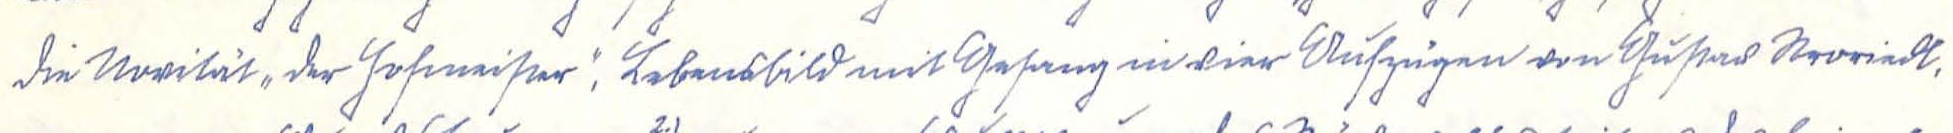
die Novität "Der Hofmeister“, Lebensbild mit Gesang in vier Aufzügen von Gustav Stroriedl,
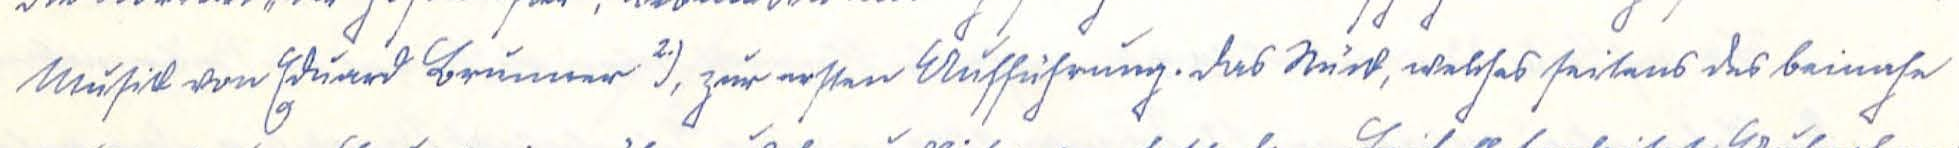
Musik von Eduard Brenner 2.) zur ersten Aufführung. Das Stück, welches seitens des beinahe
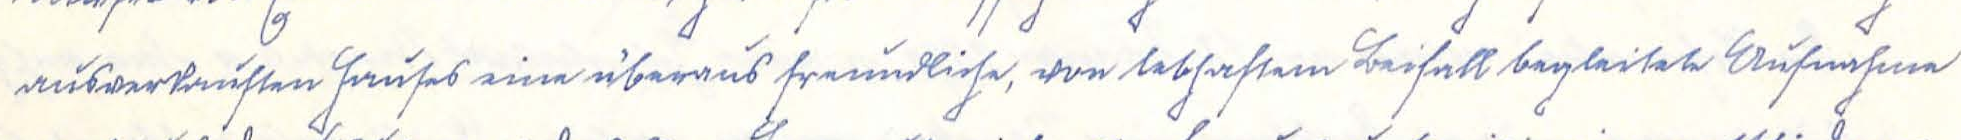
ausverkauften Hauses eine überaus freundliche, von lebhaftem Beifall begleitete Aufnahme
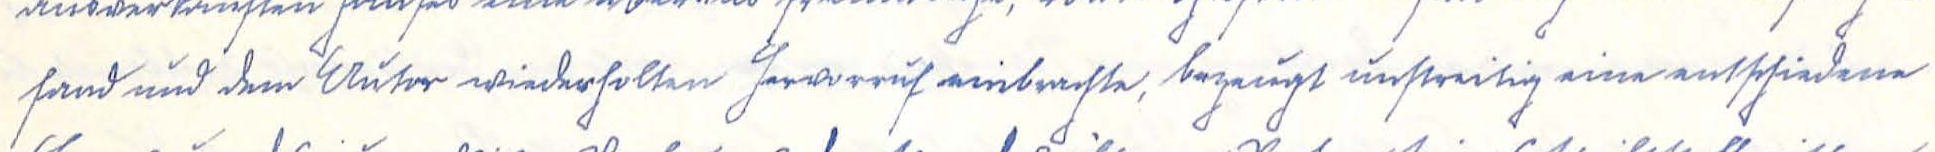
fand und den Autor wiederholten Hervorruf einbrachte, bezeugte unstreitig eine entschiedene
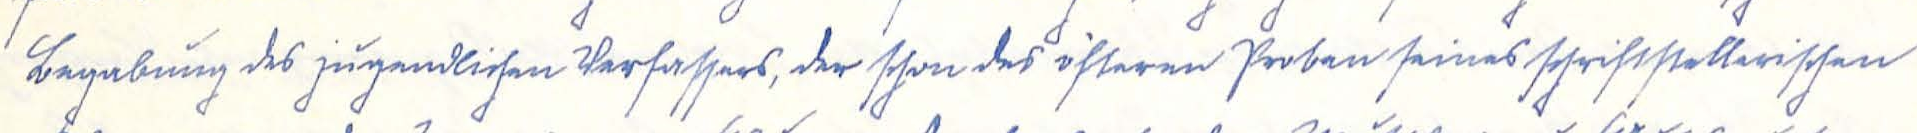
Begabung des jugendlichen Verfassers, der schon des öfteren Proben seines schriftstellerischen
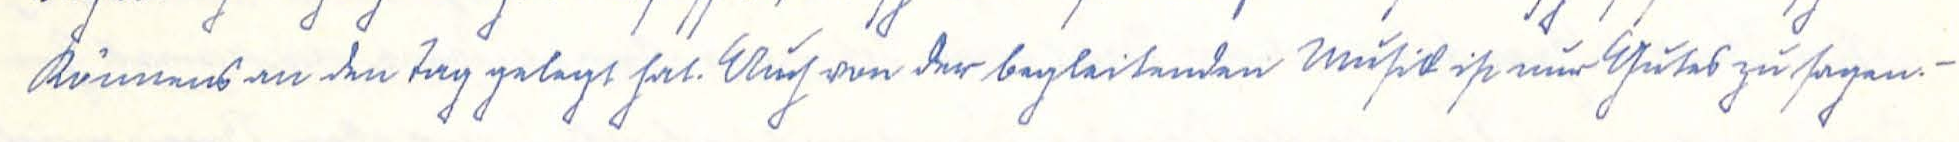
Könnens an den Tag gelegt hat. Auch von der begleitenden Musik ist nur Gutes zu sagen.
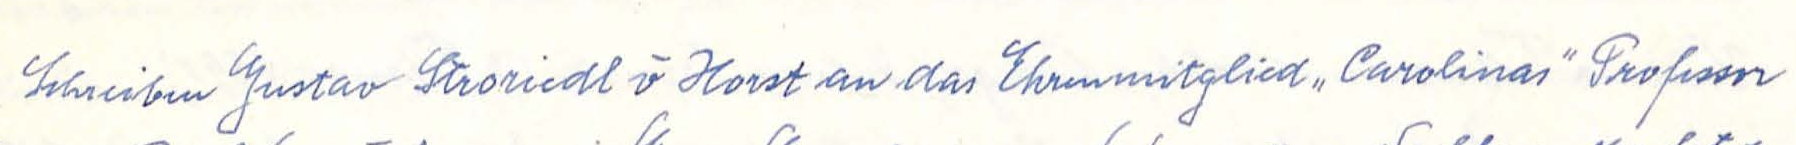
Schreiben Gustav Stroriedl v/o Horst an das Ehrenmitglied "Carolinas" Professor
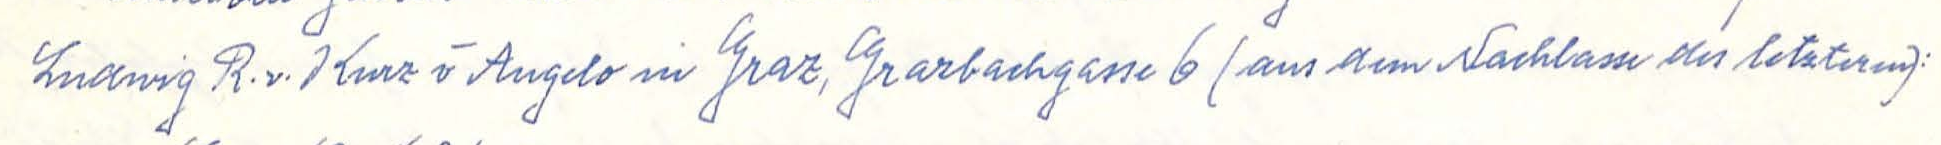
Ludwig R. v. Kurz v/o Angelo in Graz, Grarbachgasse 6 (aus dem Nachlasse des letzteren):
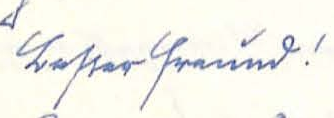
Bester Freund!
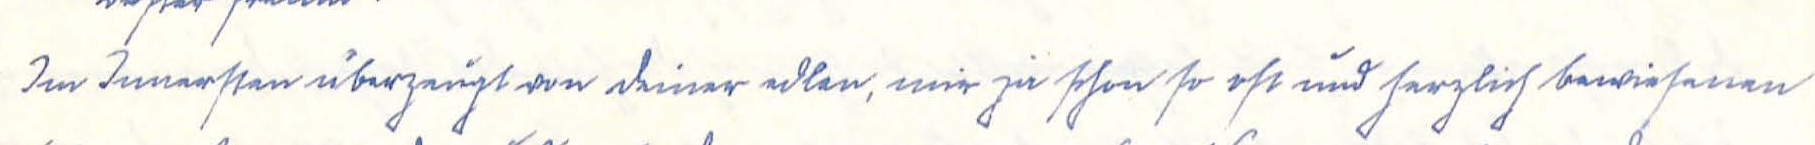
Im Innersten überzeugt von deiner edlen, mir ja schon so oft und herzlich bewiesenen
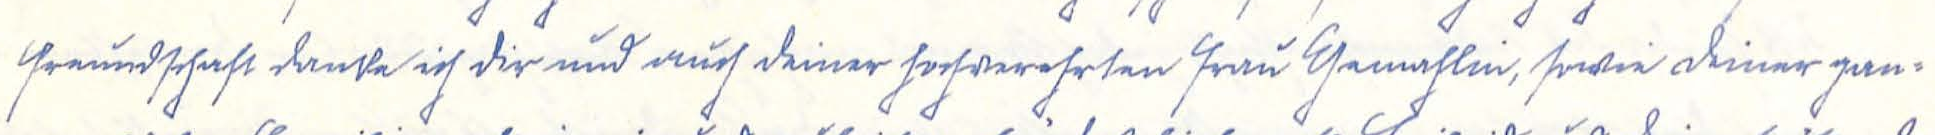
Freundschaft danke ich dir und auch deiner hochverehrten Frau Gemahlin, sowie deiner gan-
